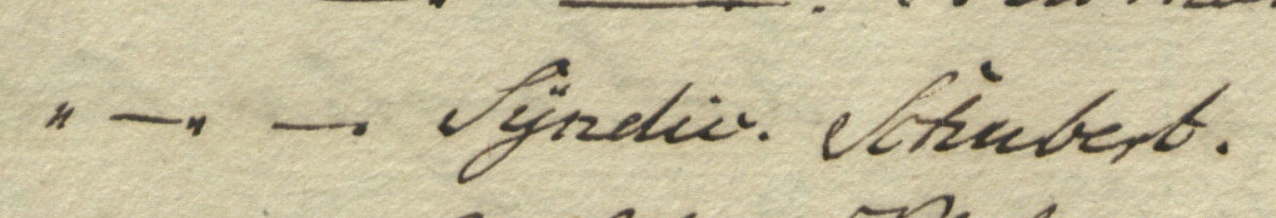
Sÿndic. Schubert.
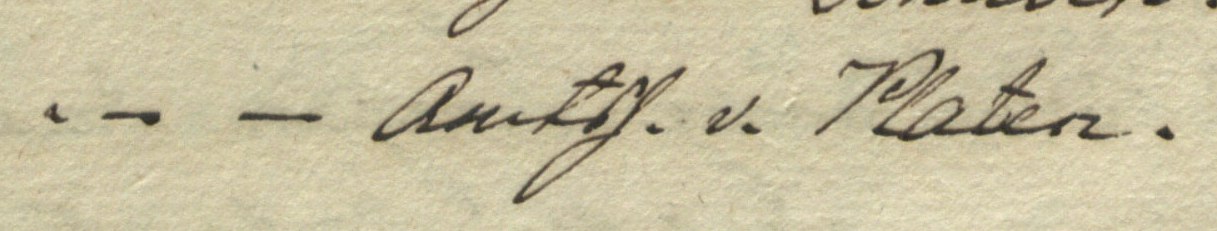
Amtsh. v. Platen.
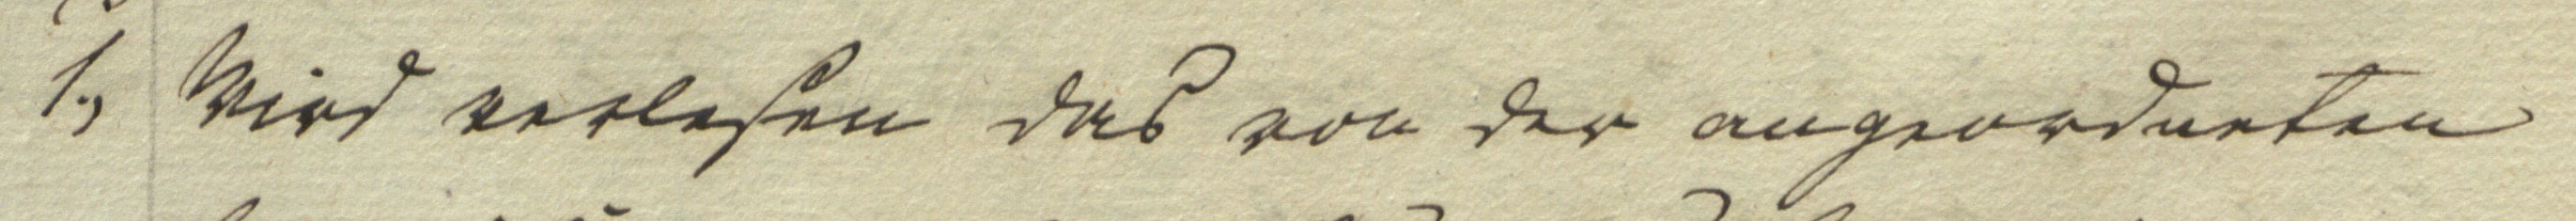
1., Wird verlesen das von der angeordneten
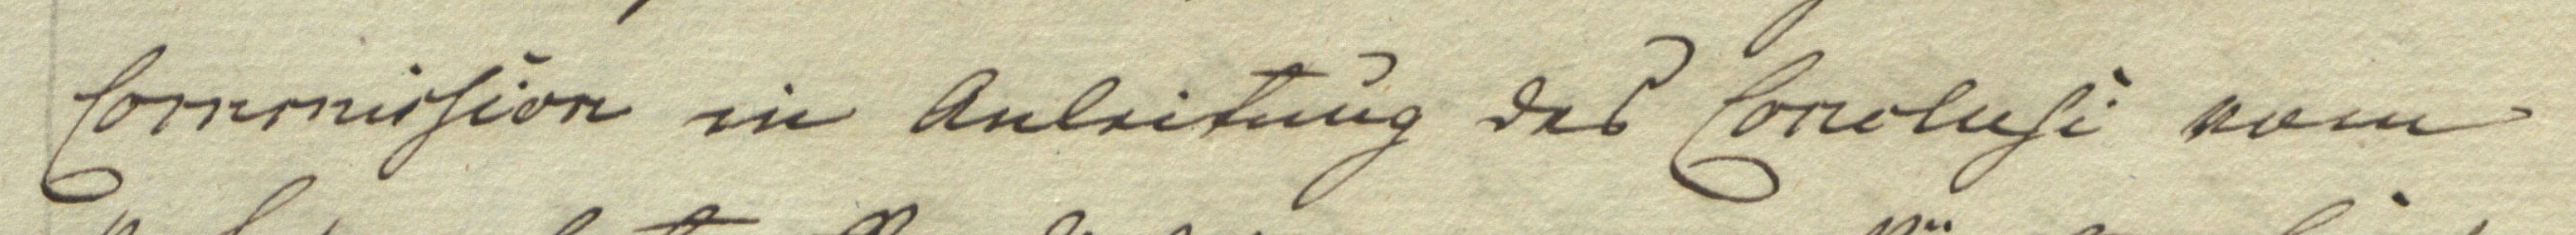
Commission in Anleitung des Conclusi vom
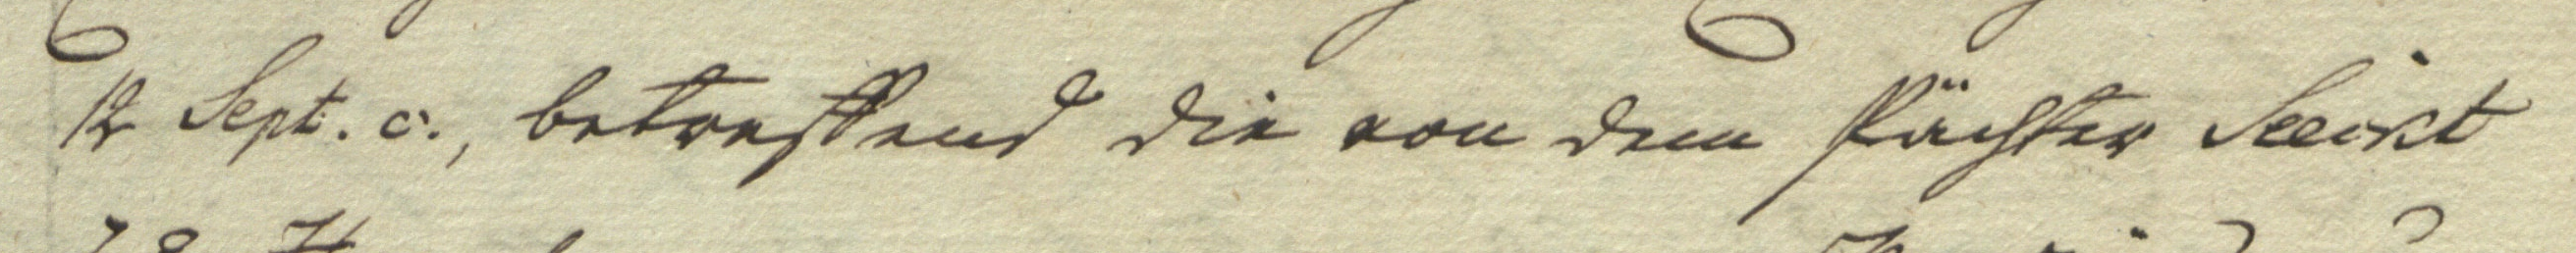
12. Sept. c., betreffend die von dem Pächter Seeckt
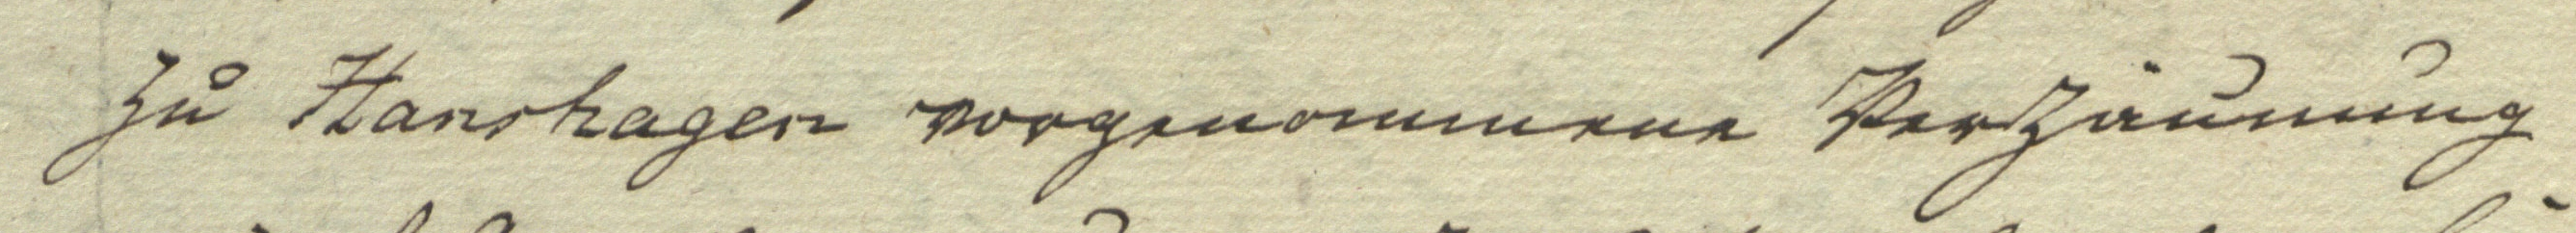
zu Hanshagen vorgenommene Verzäumung
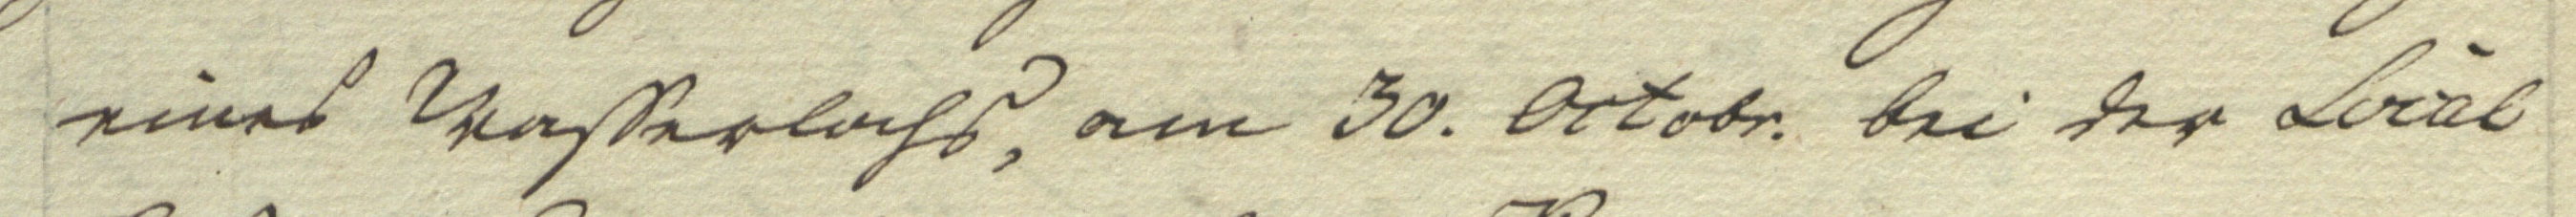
eines Wasserlochs, am 30. Octobr. bei der Local¬
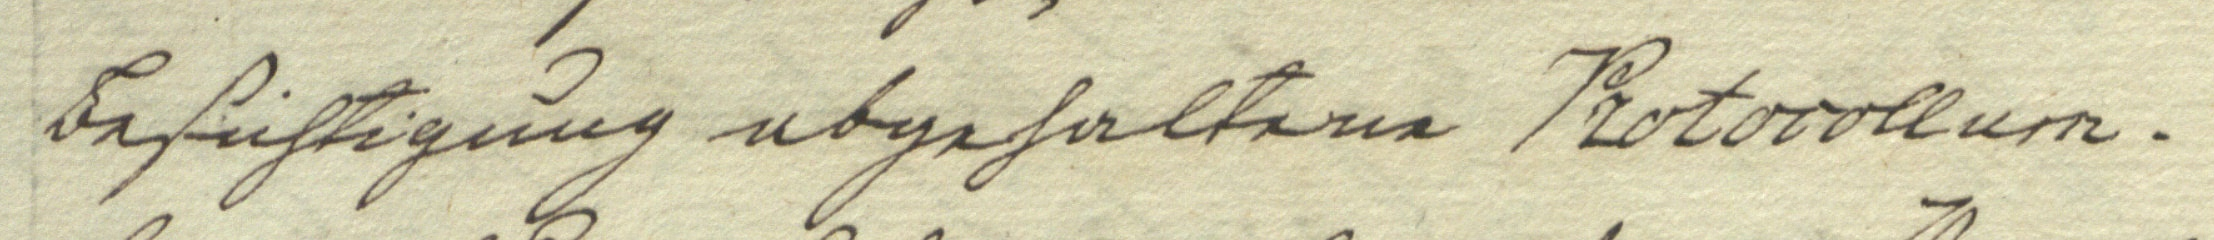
Besichtigung abgehaltene Protocollum.
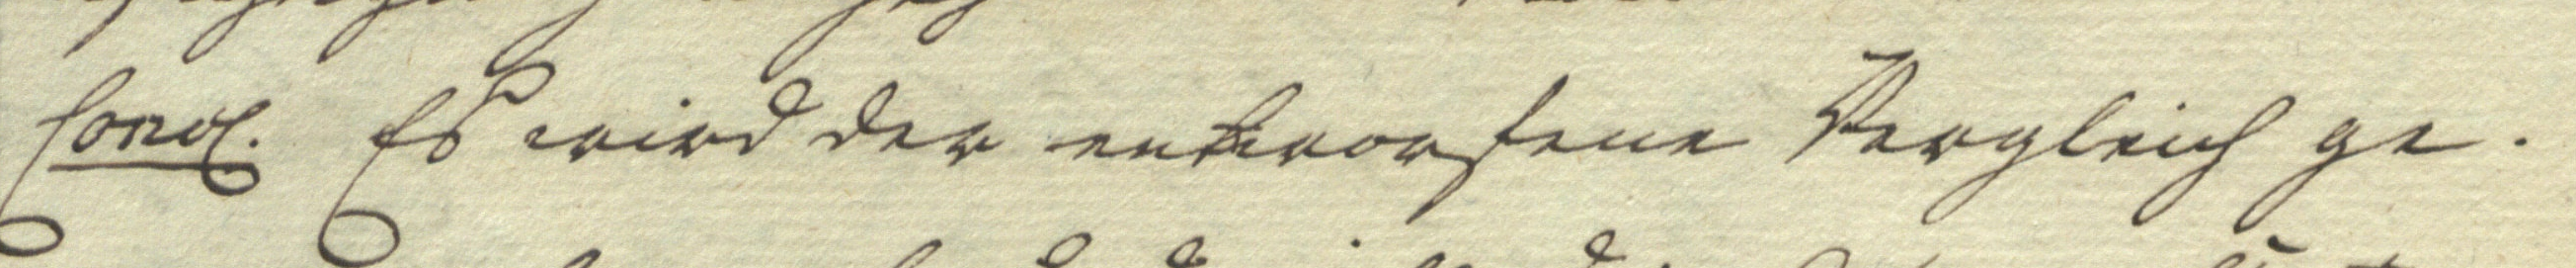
Concl. Es wird der entworfene Vergleich ge¬
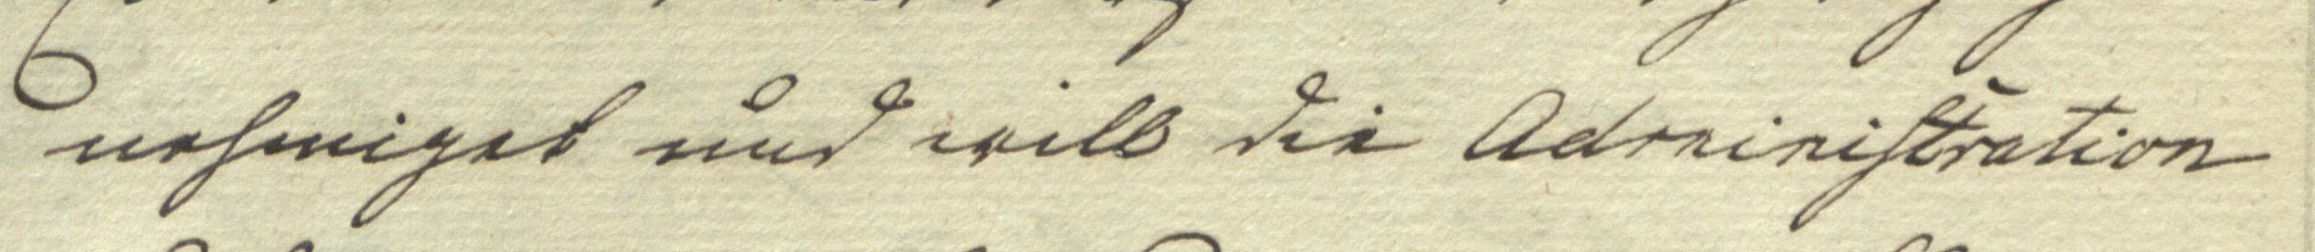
nehmiget und will die Administration
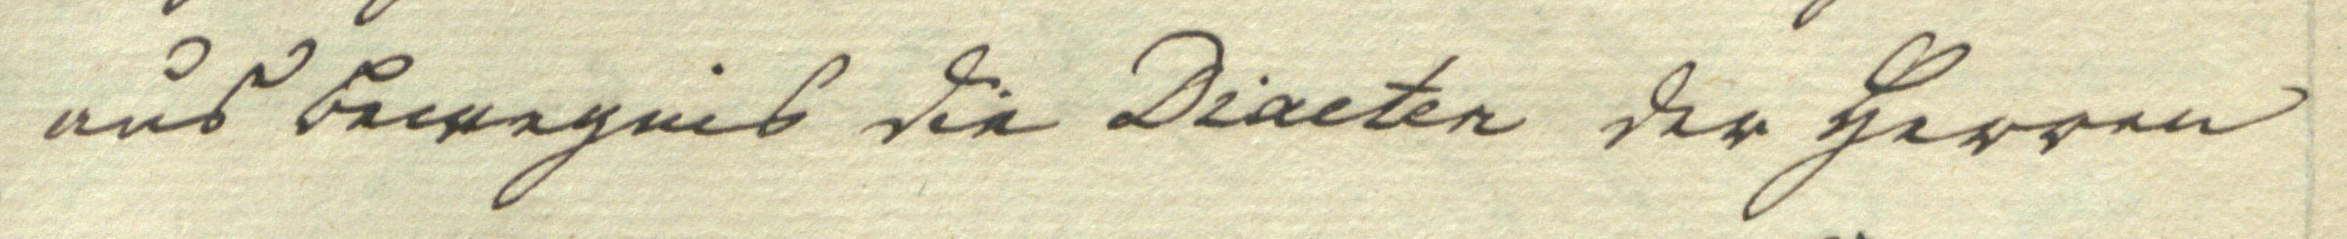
aus Bewegnis die Diaeten der Herren
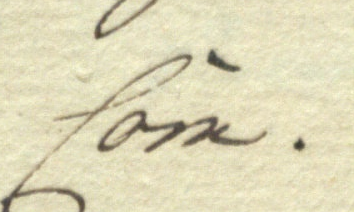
Com¬
